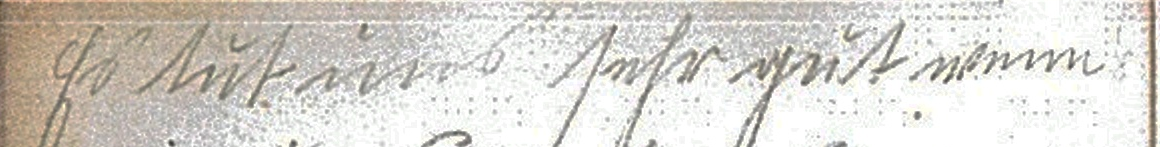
Es tut uns sehr gut wenn
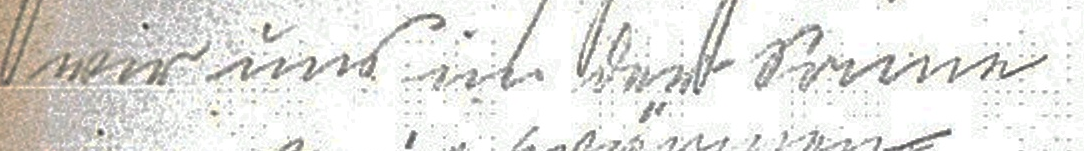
wir uns in der Sonne
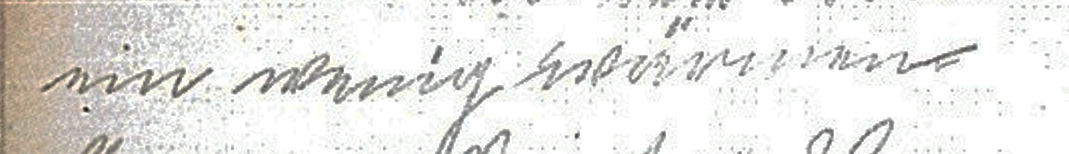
ein wenig wärmen
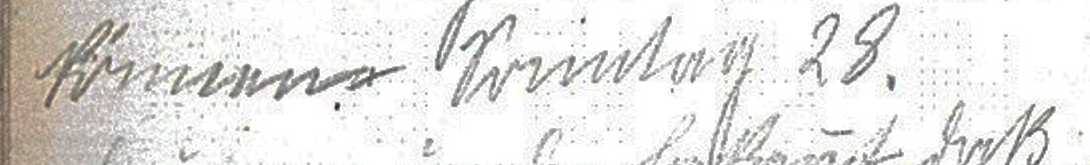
können. Sonntag 28.
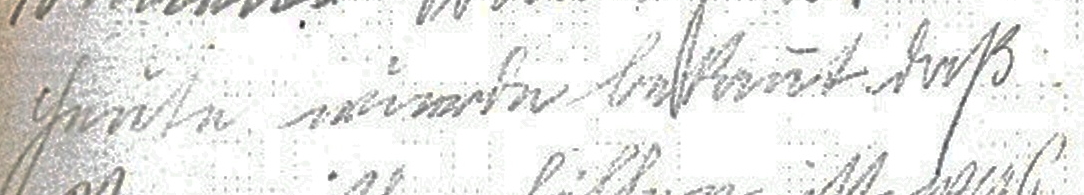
Heute wurde bekannt daß
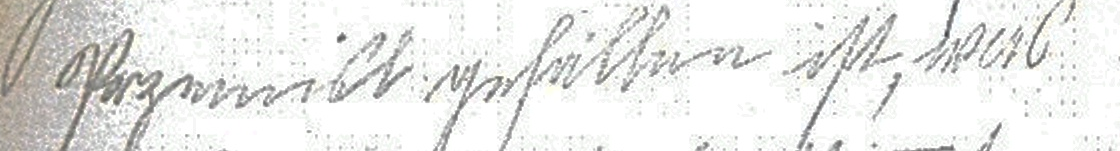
Przemysl gefallen ist, was
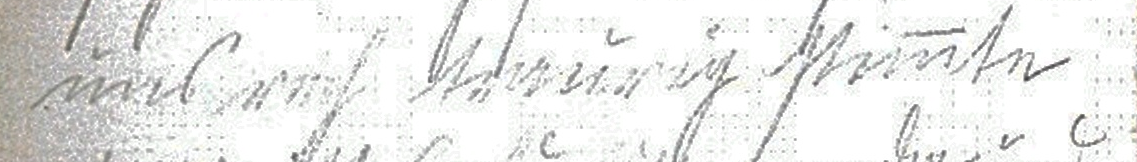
uns weh traurig stimmte
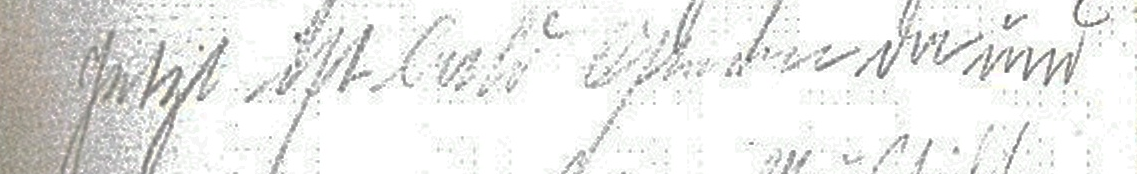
Jetzt ist bald Ostern da und
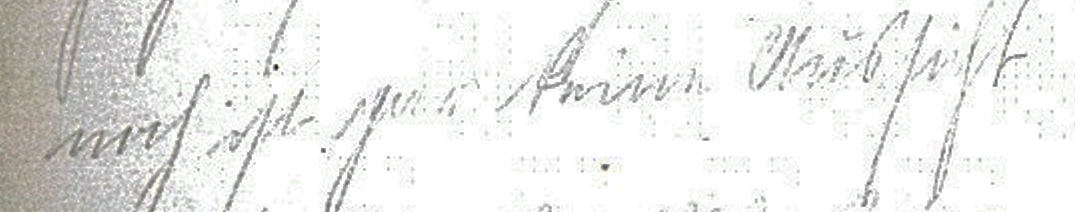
noch ist gar keine Aussicht
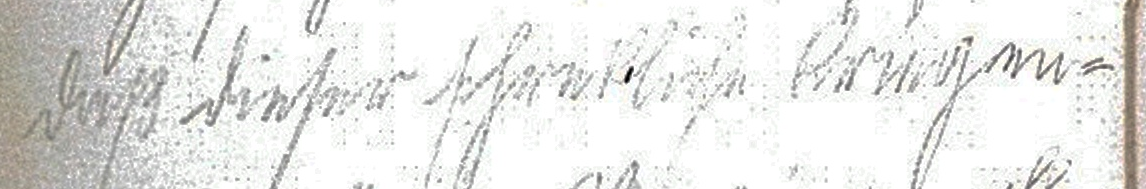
daß dieser schreckliche Krieg en-
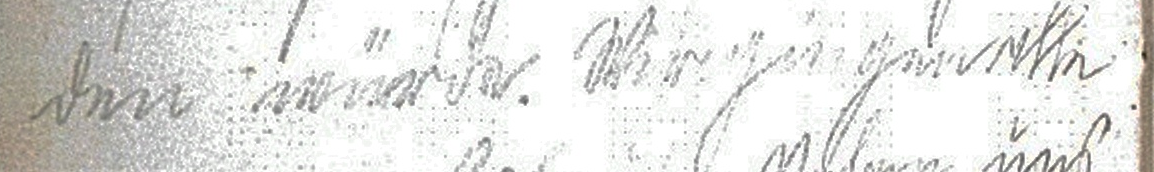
den würde. Wir gingen alle
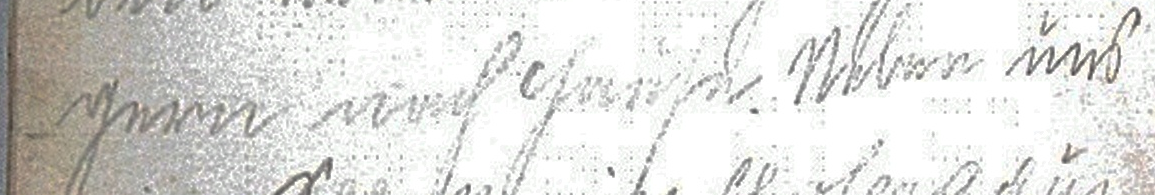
gern nach Hause. Neben uns
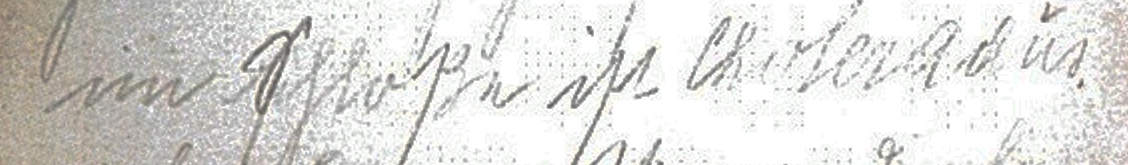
im Schloß ist Cholera aus-
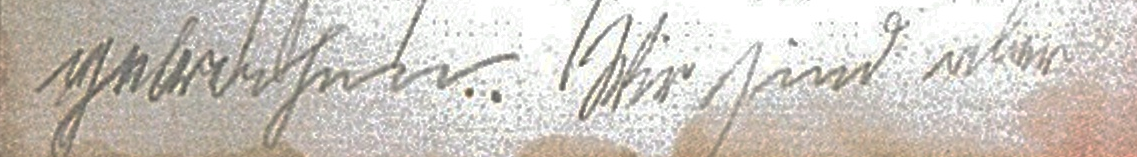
gebrochen. Wir sind aber
